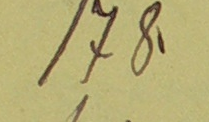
178
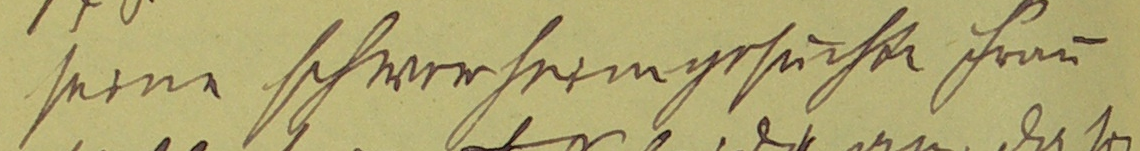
seine schwer heimgesuchte Frau
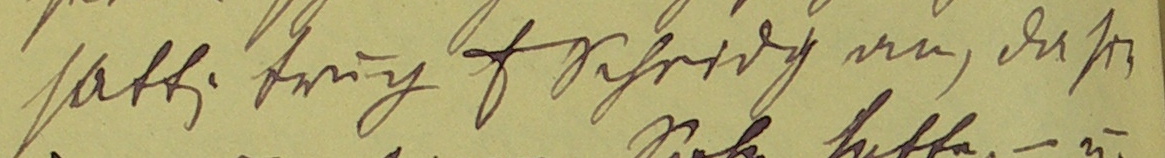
statt; trug f Scheidung an, da sie
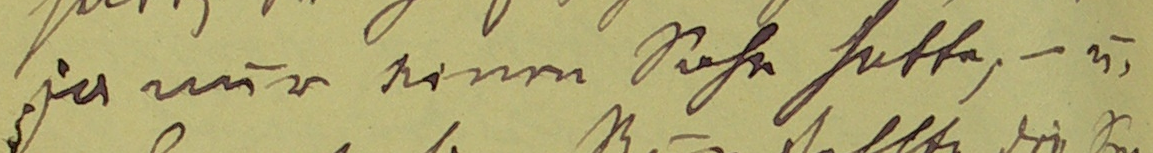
ja nur einen Sohn hatte; - u.
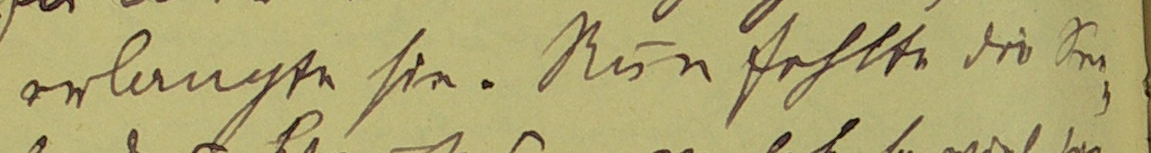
erlangte sie. Nun fehlte die See¬
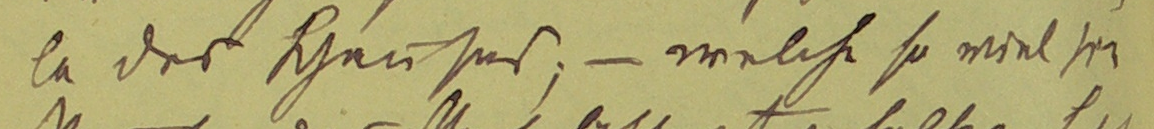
le des Hauses;-- welche so viel sie
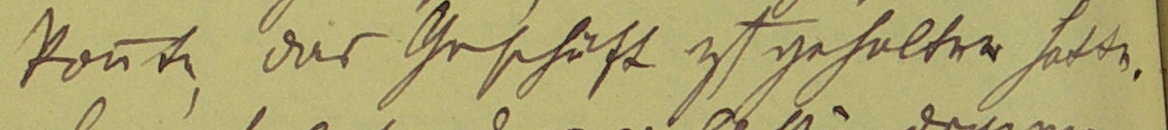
konnte, das Geschäft zs gehalten hatte.
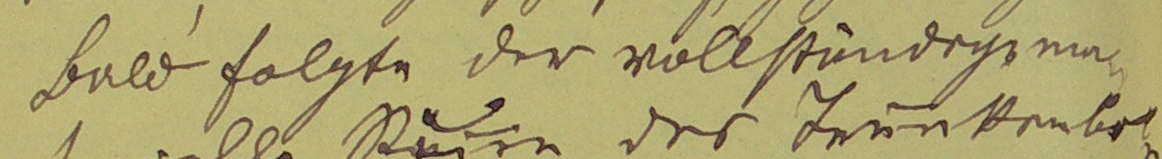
Bald folgte der vollständige ma¬
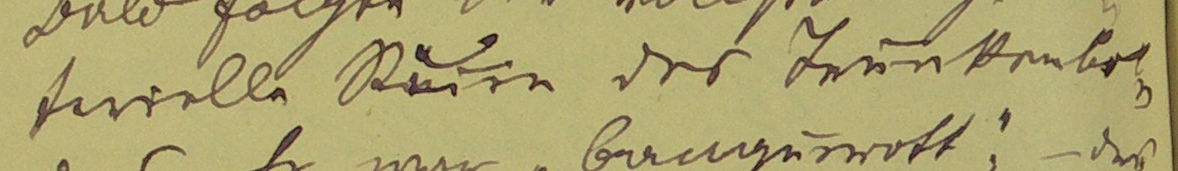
terielle Ruin des Trunkenbol¬
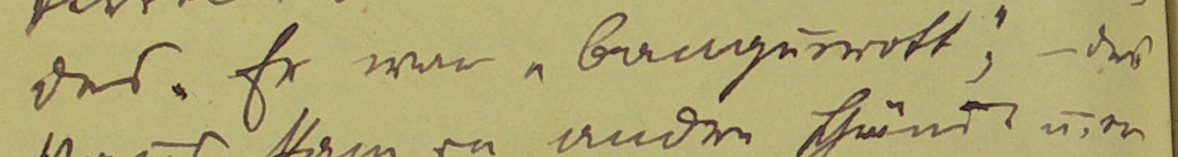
des. Er war „ banquerott“; - das
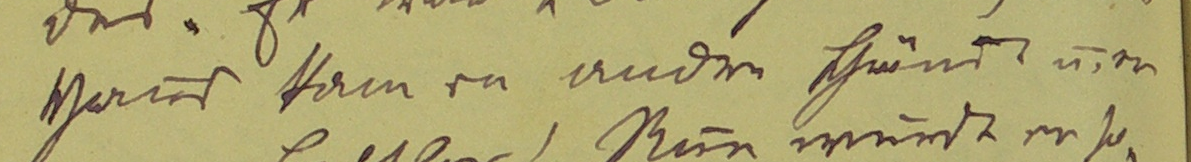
Haus kam in andere Hände u. er
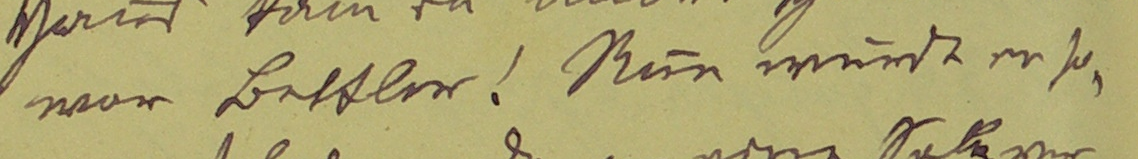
war Bettler ! - Nun wurde er so¬
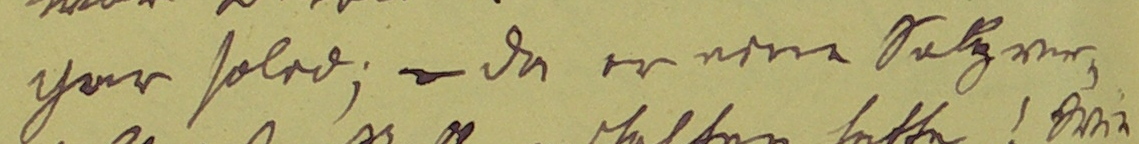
gar solid; - da er eine Salzver¬
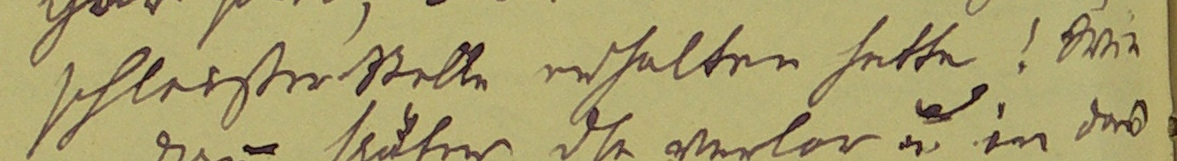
schleißer Stelle erhalten hatte! Wie
